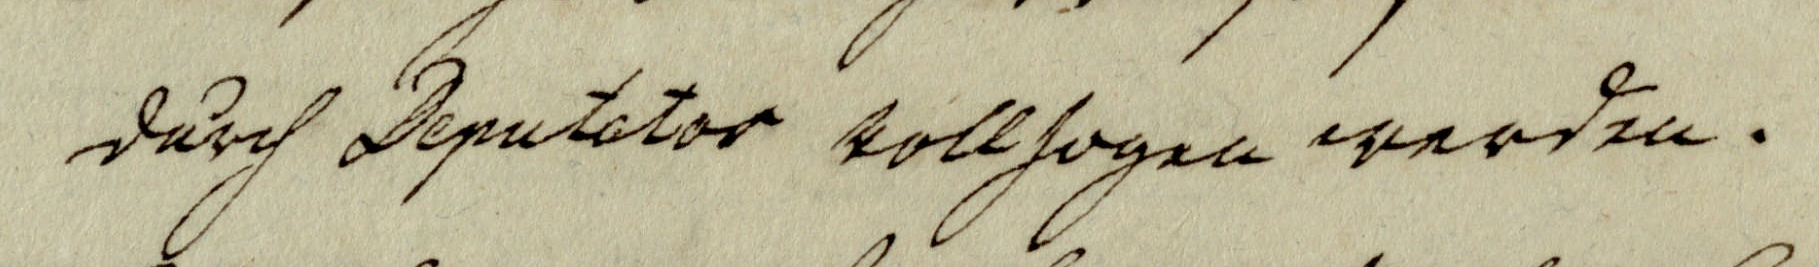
durch Deputatos vollzogen werden.
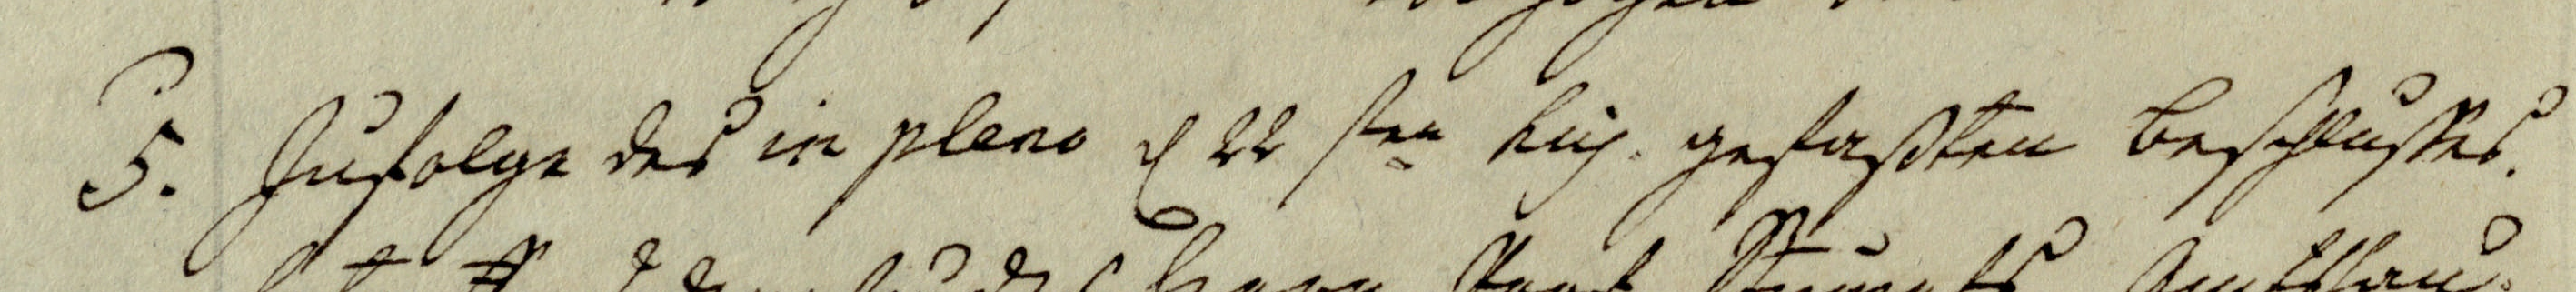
5. Zufolge des in pleno d 22 ten huj. gefaßten Beschlusses,
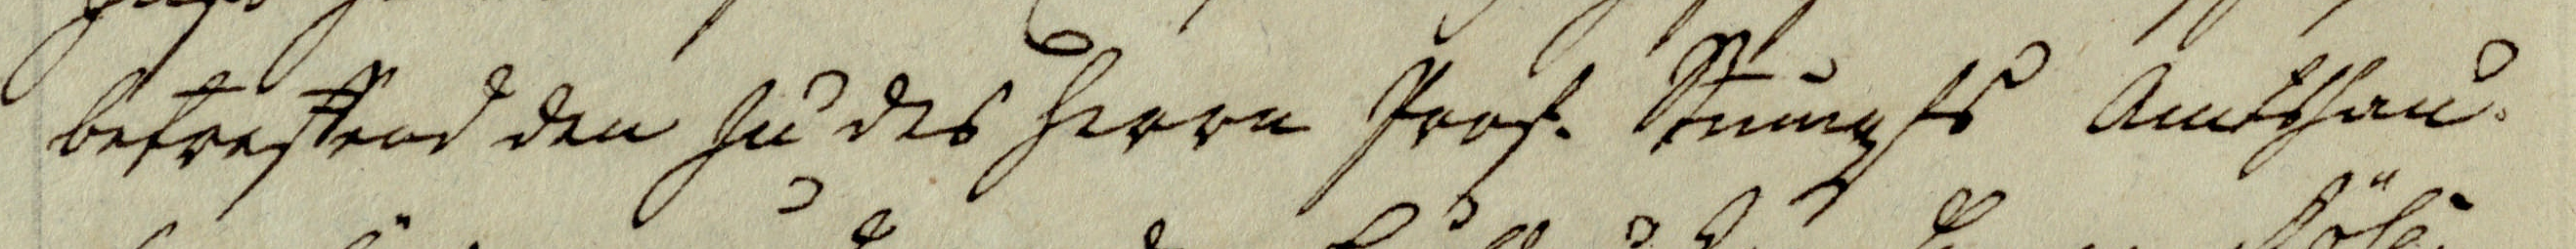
betreffend den zu des Herrn Prof. Stumpfs Amtshau¬
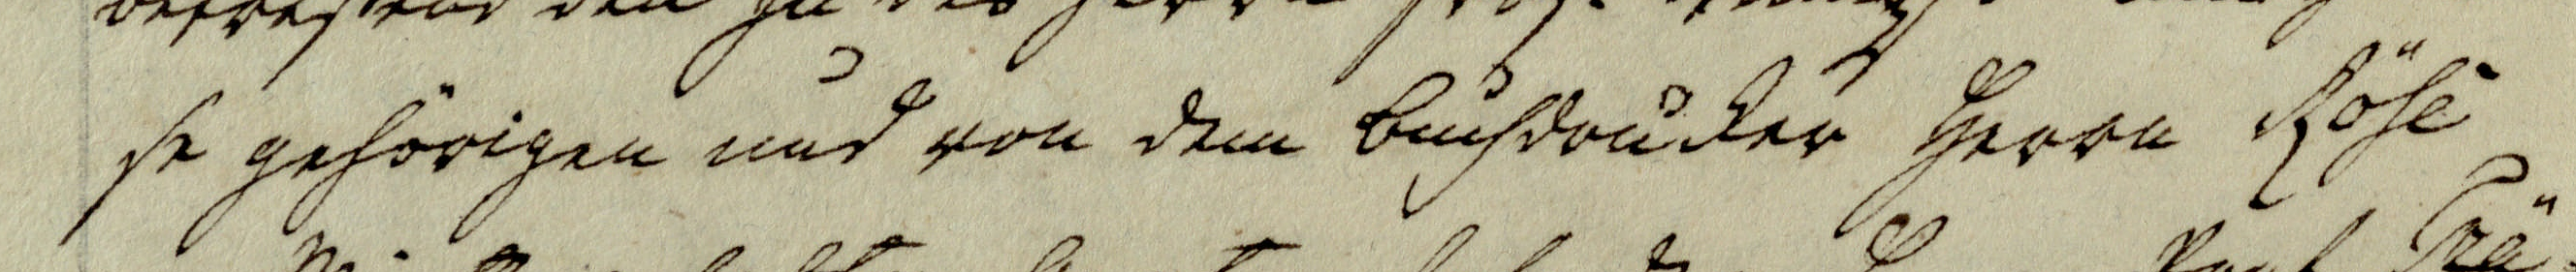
se gehörigen und von dem Buchdrucker Herrn Röse
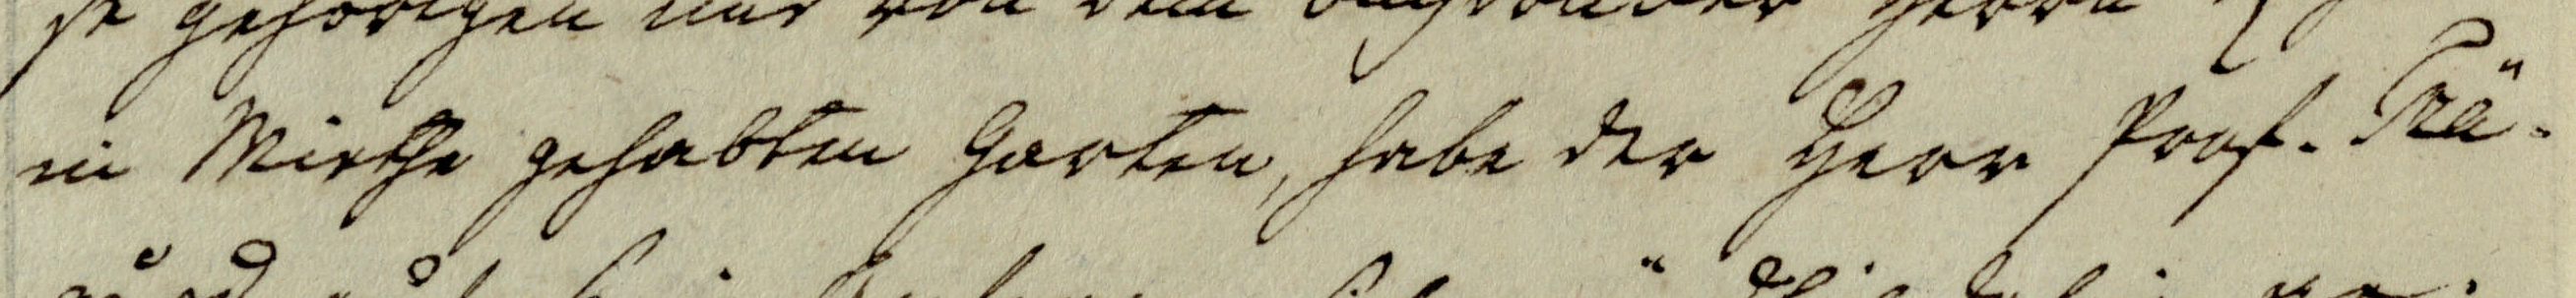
in Miethe gehabten Garten, habe der Herr Prof. Trä¬
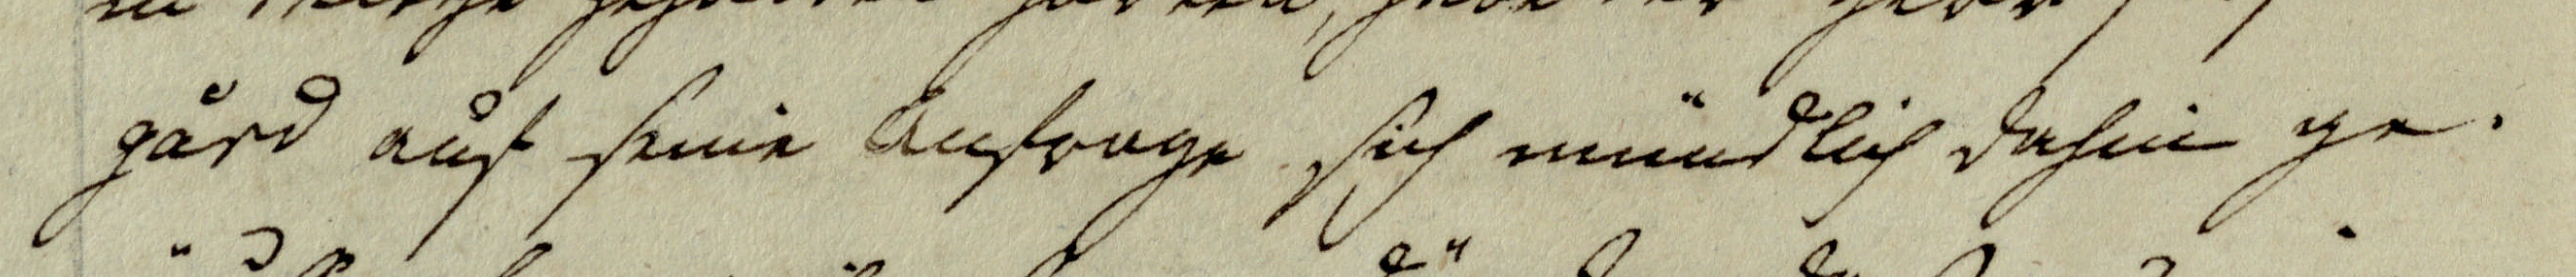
gård auf seine Anfrage sich mündlich dahin ge¬
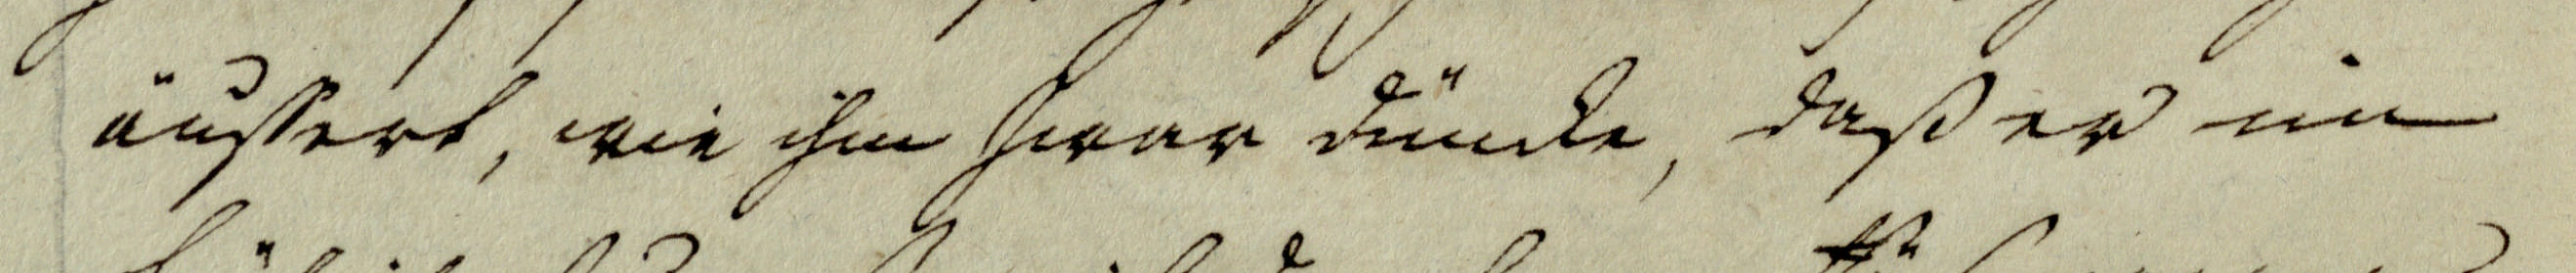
äussert, wie ihm zwar düncke, daß er im
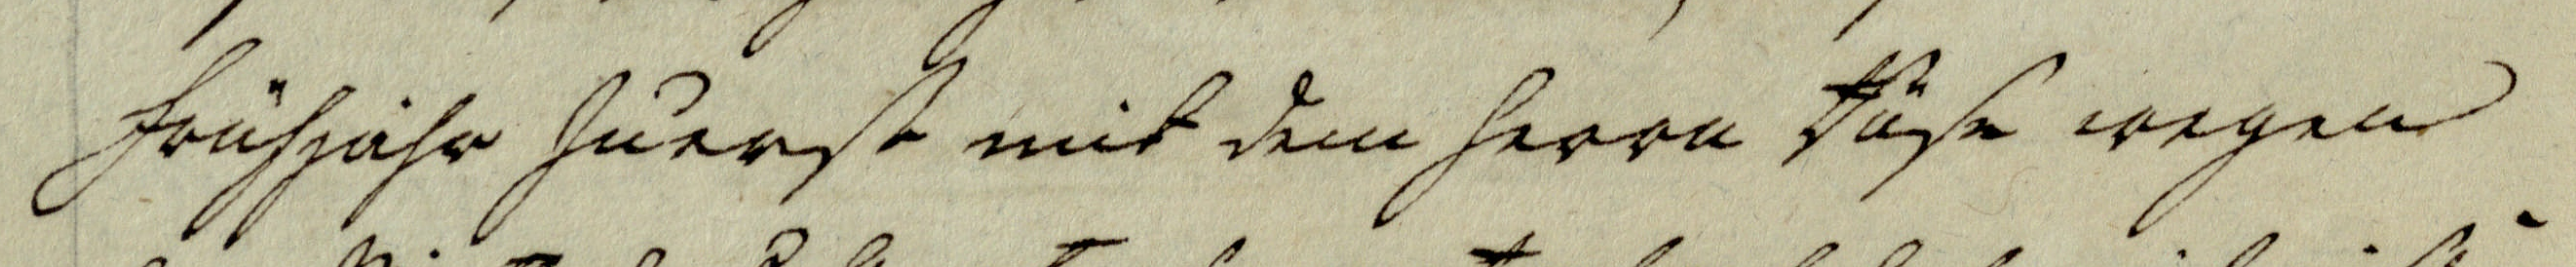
Frühjahr zuerst mit dem Herrn Röse wegen
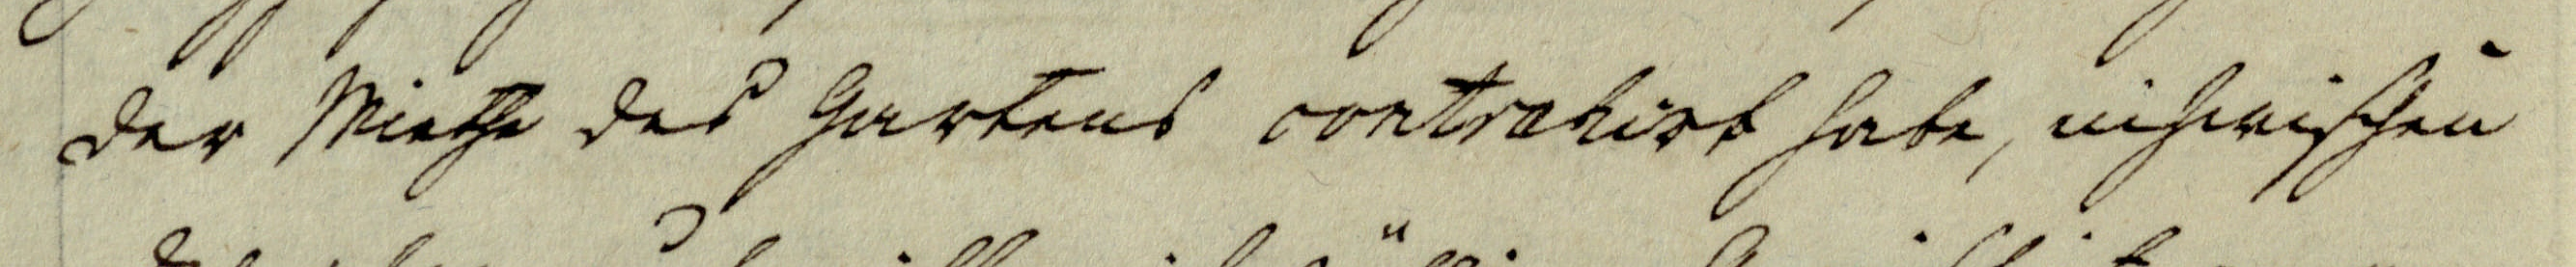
der Miethe des Gartens contrahirt habe, inzwischen
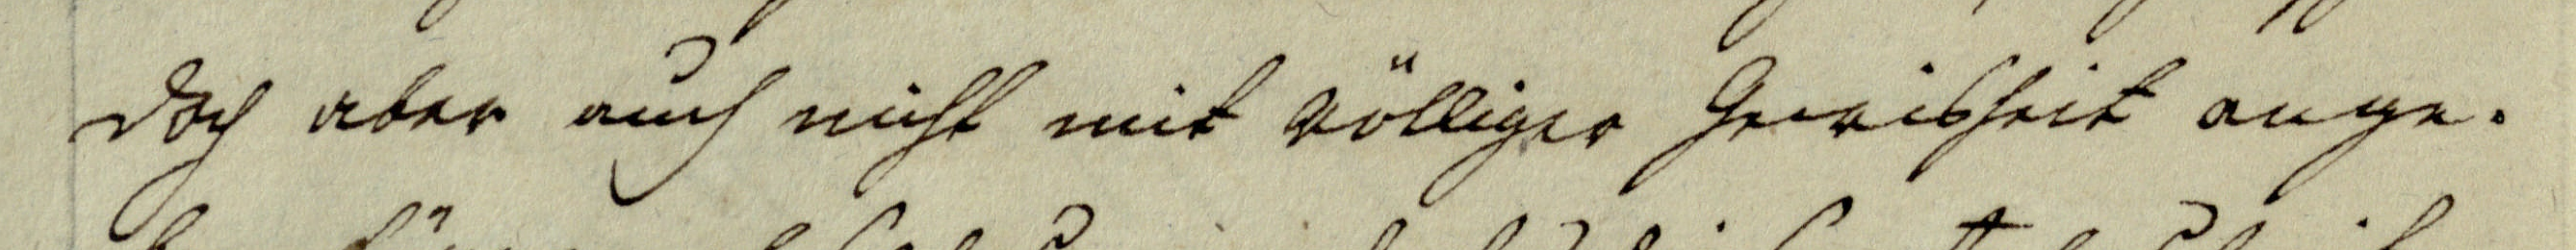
doch aber auch nicht mit völliger Gewisheit ange¬
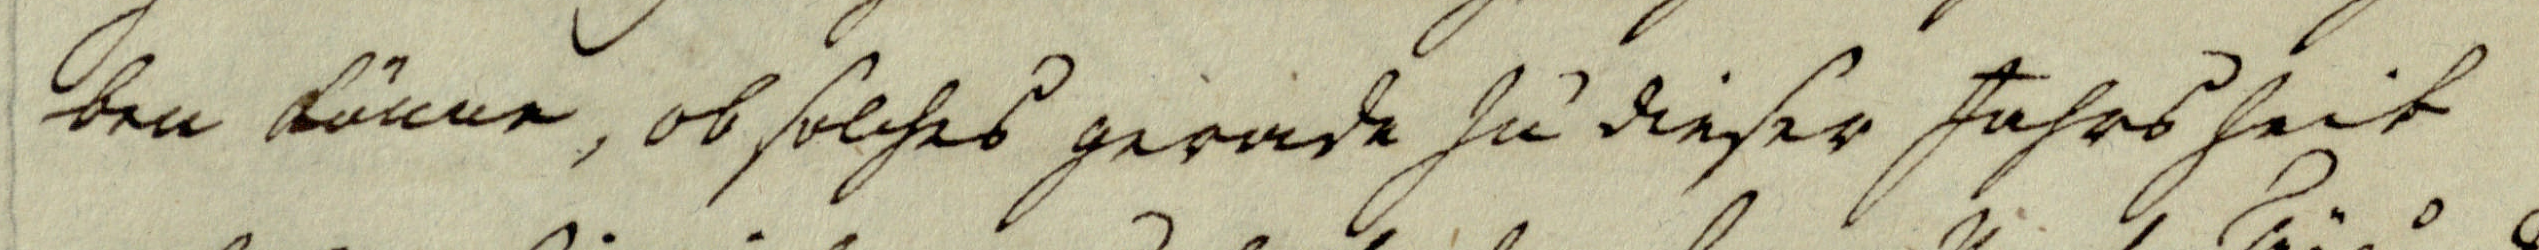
ben könne, ob solches gerade zu dieser Jahrszeit
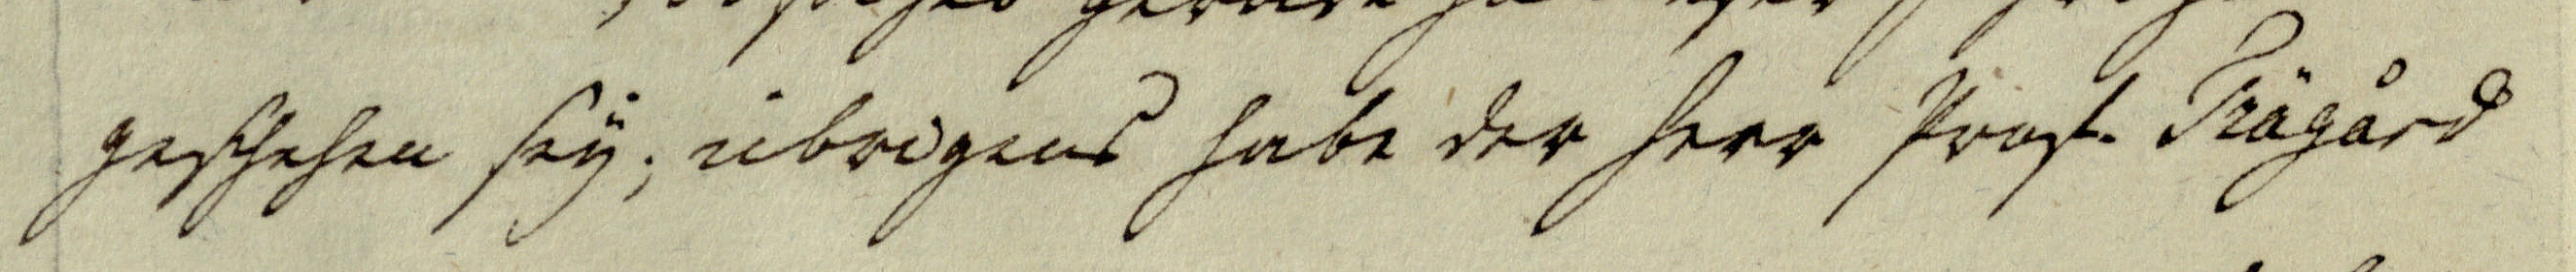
geschehen seÿ; übrigens habe der Herr Prof. Trägård
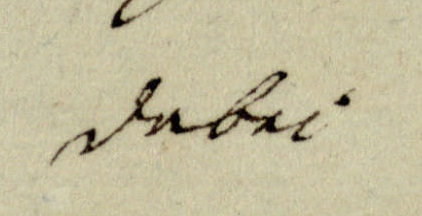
dabei
